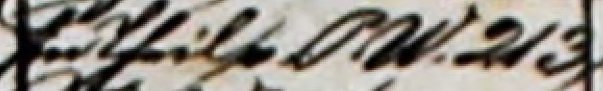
Ein Theil v P.W. 213
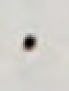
„
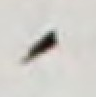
„
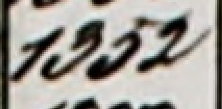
1352
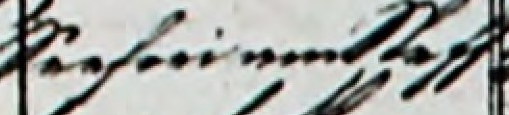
Seefrei am Staff„
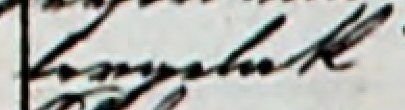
tergelak
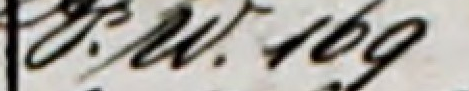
P.W. 169
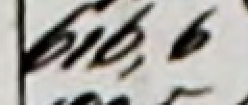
616,6
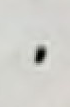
„
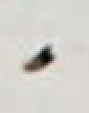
„
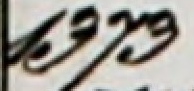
1373
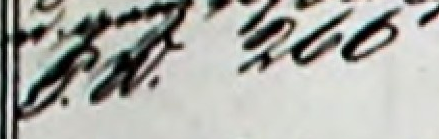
P.W. 266
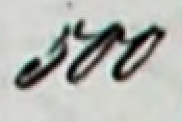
500
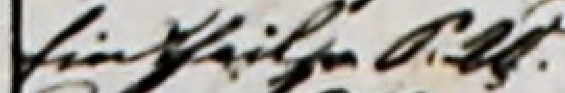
Ein Theil v P.W.
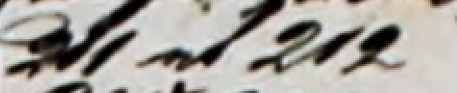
211 et 212
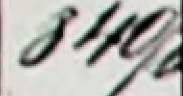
840/b
